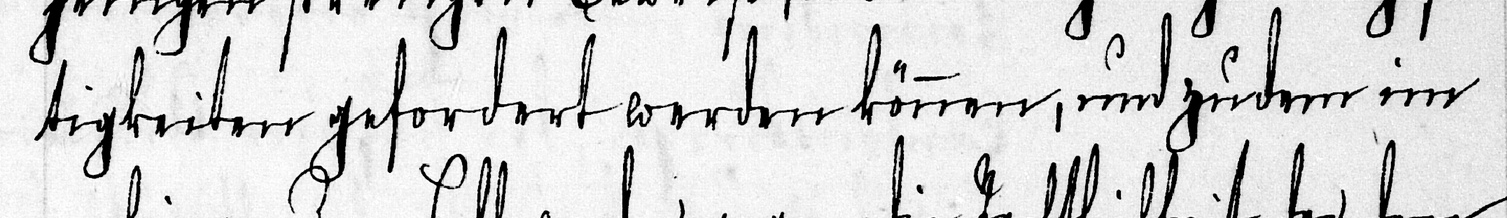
itigkeiten gefordert werden können, und zudem im
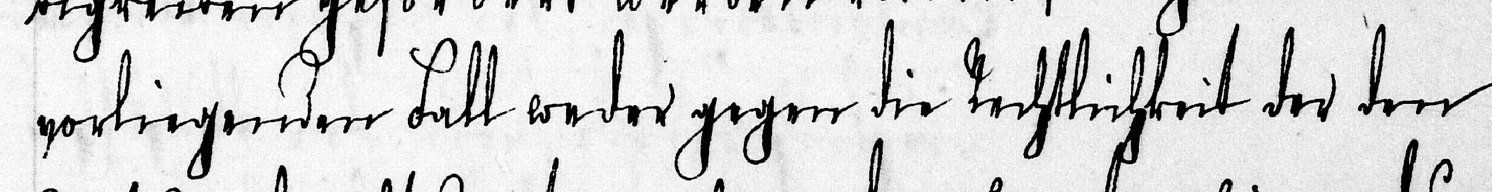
vorliegenden Fall weder gegen die Rechtlichkeit der den
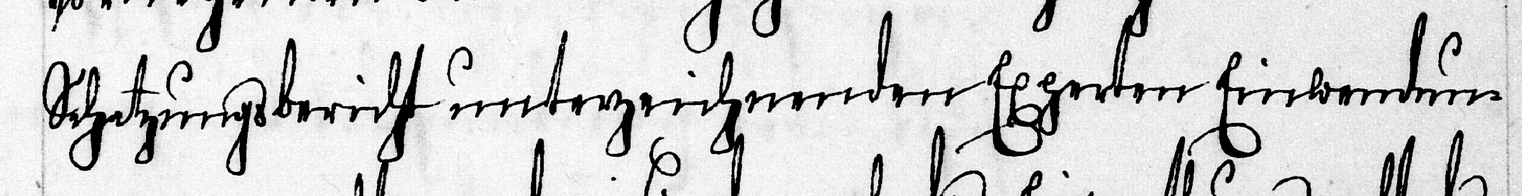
Schatzungsbericht unterzeichnenden Experten Einwendun¬
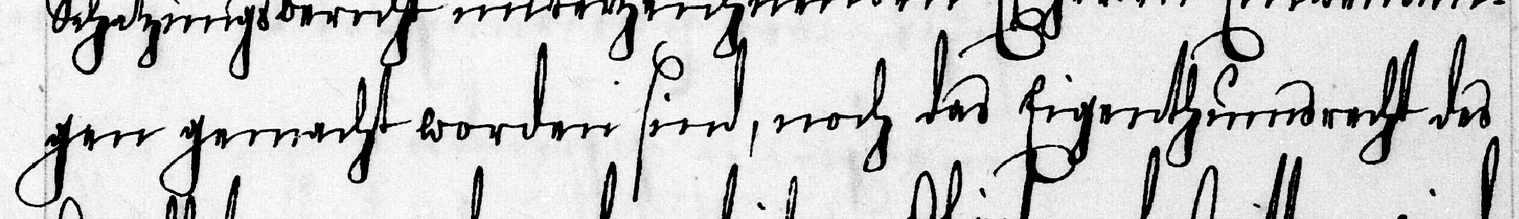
gen gemacht worden sind, noch das Eigenthumsrecht des
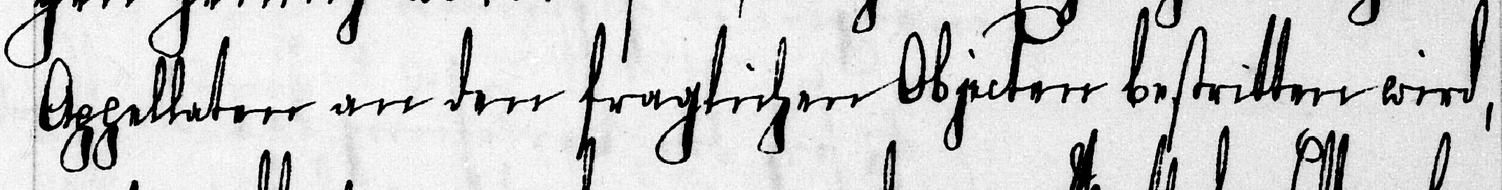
Appellaten an den fraglichen Objecten bestritten wird,
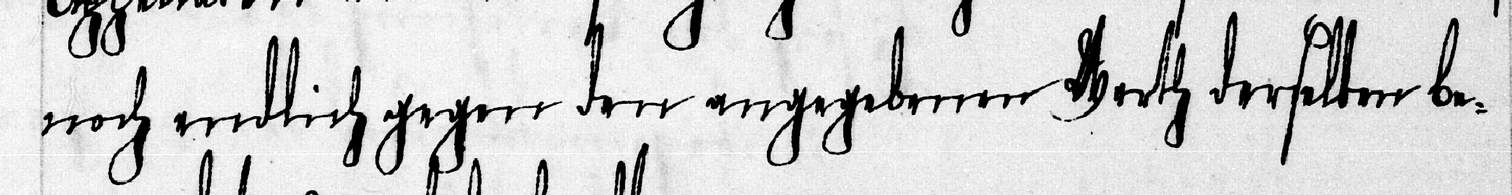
noch endlich gegen den angegebenen Werth derselben be¬
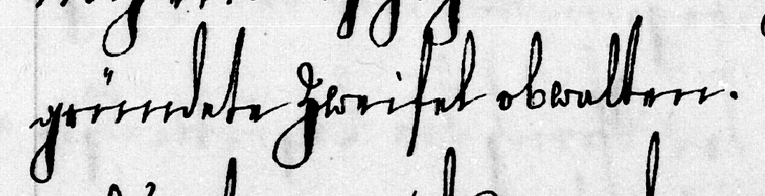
gründete Zweifel obwalten.
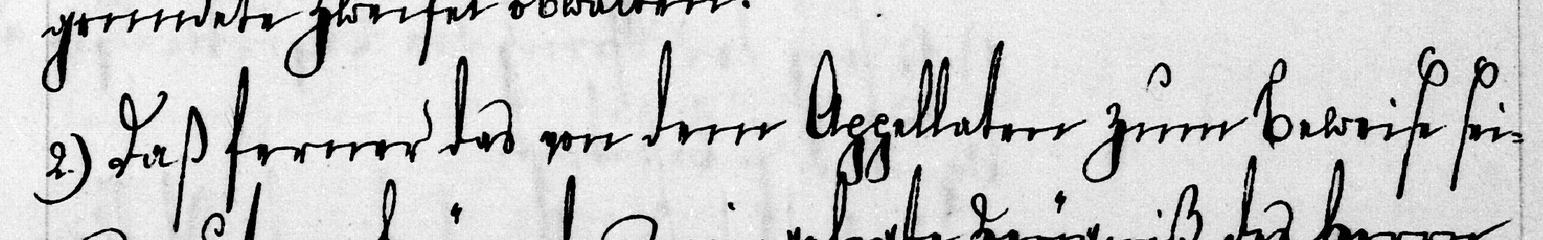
2.) Daß ferner das von dem Appellaten zum Beweise se¬
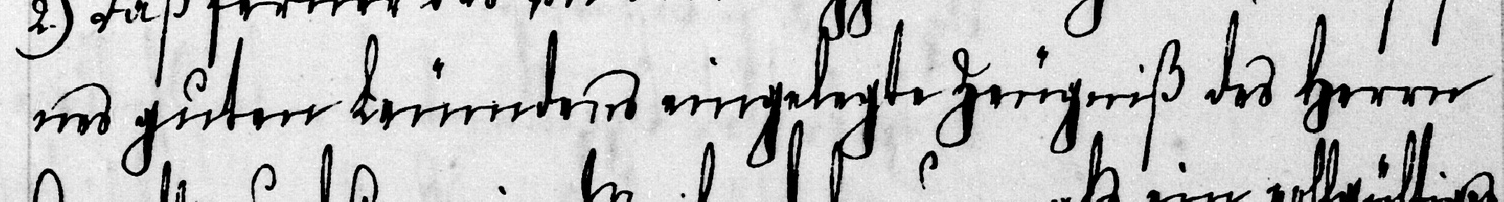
ines guten Leumdens eingelegte Zeugniß des Herrn
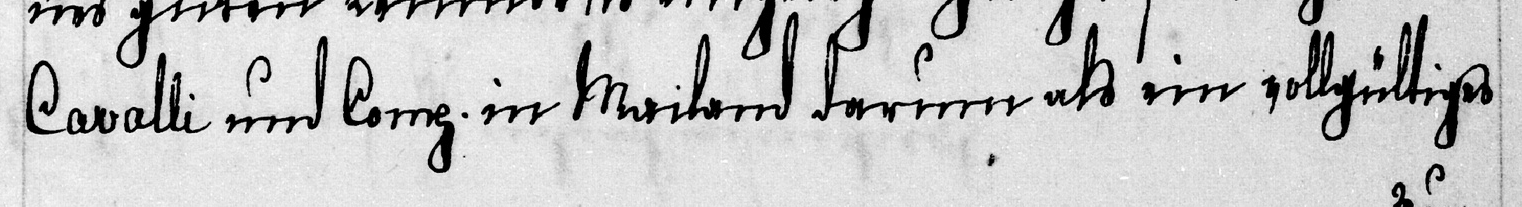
Cavalli und Comp. in Mailand darum als ein vollgültiges
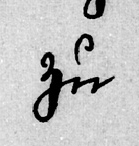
zu
